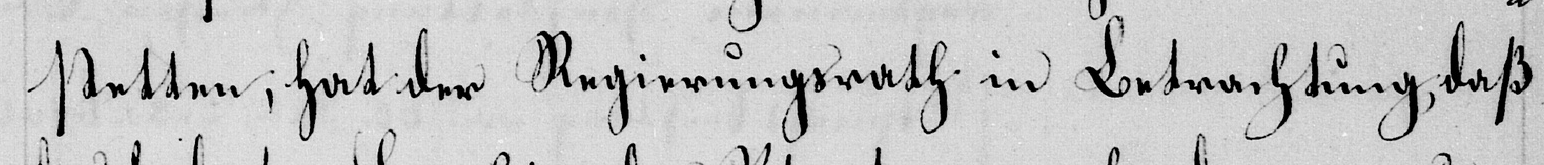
stetten, hat der Regierungsrath in Betrachtung, daß
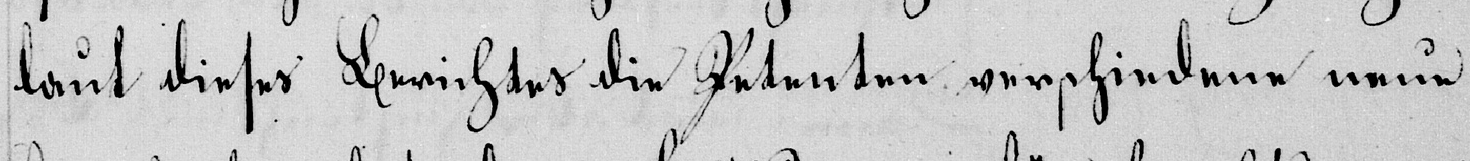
laut dieses Berichtes die Petenten verschiedene neue
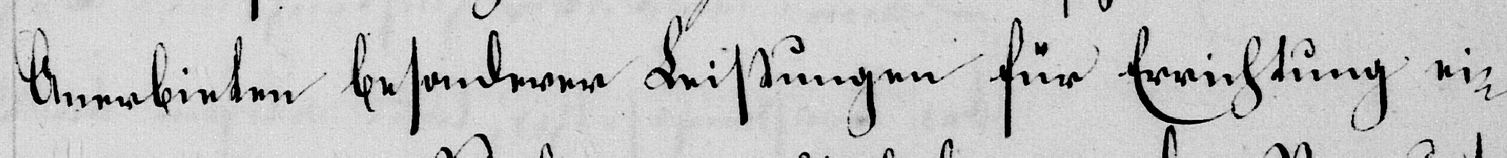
Anerbieten besonderer Leistungen für Errichtung ei¬
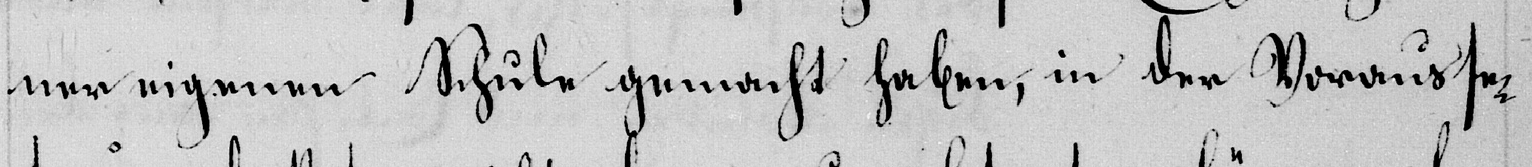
ner eigenen Schule gemacht haben, in der Vorausse¬
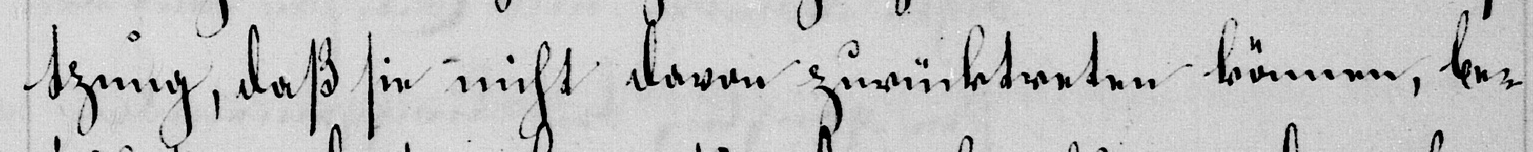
tzung, daß sie nicht davon zurücktreten können, be¬
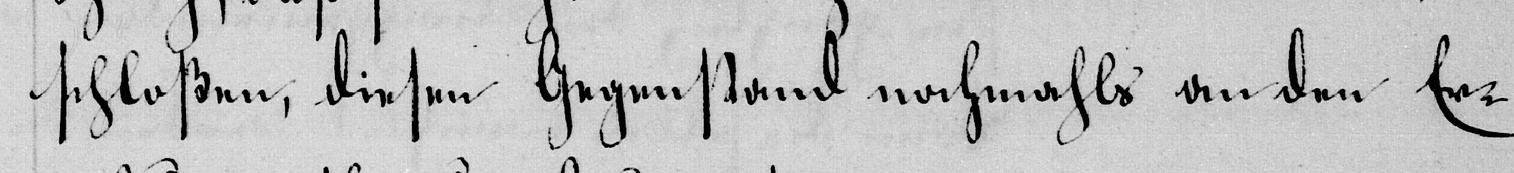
schloßen, diesen Gegenstand nochmahls an den Er¬
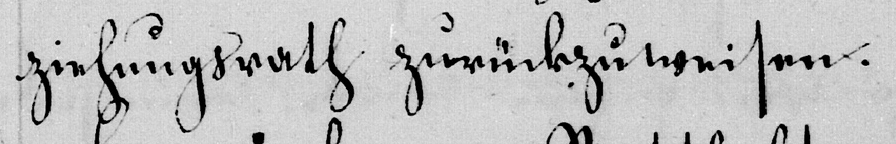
ziehungsrath zurückzuweisen.
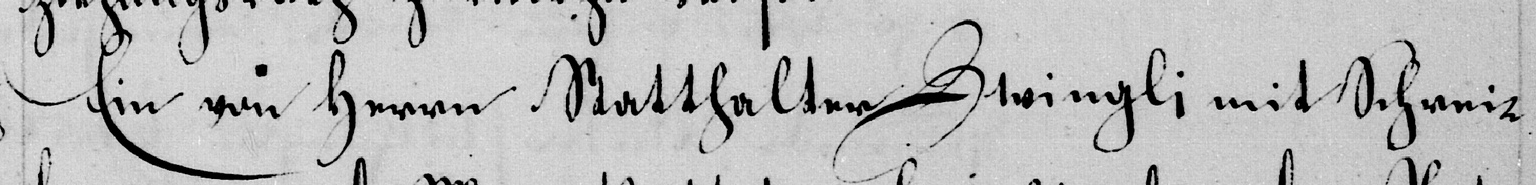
Ein von Herrn Statthalter Zwingli mit Schrei¬
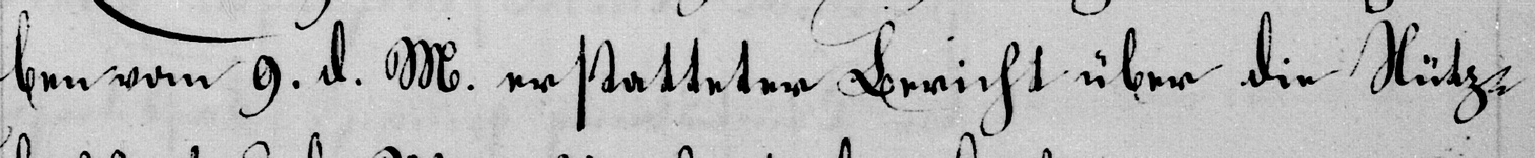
ben vom 9. d. M. erstatteter Bericht über die Nütz¬
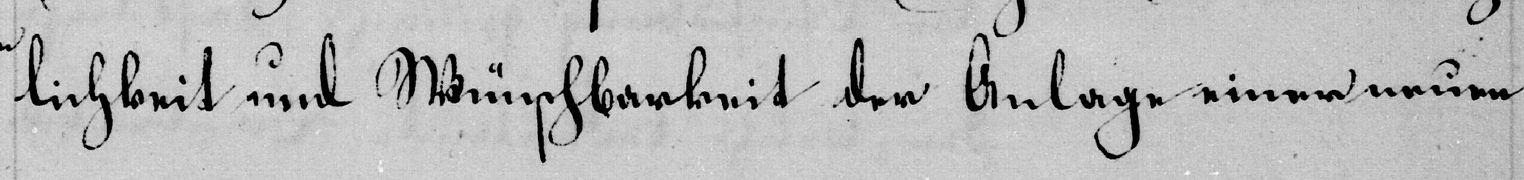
lichkeit und Wünschbarkeit der Anlage einer neuen
